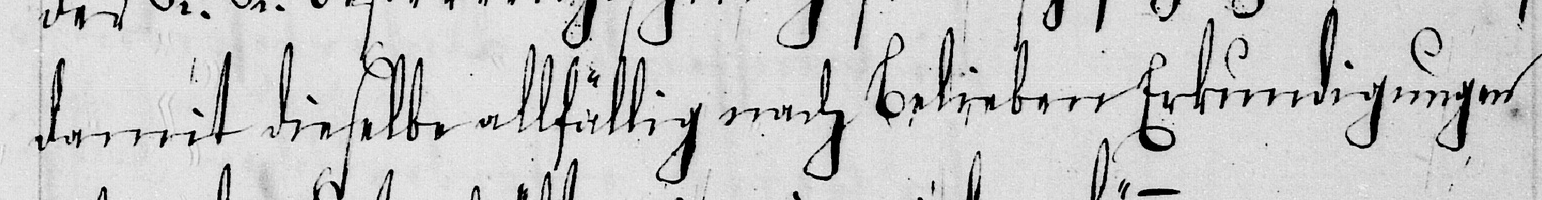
damit dieselbe allfällig nach Belieben Erkundigungen
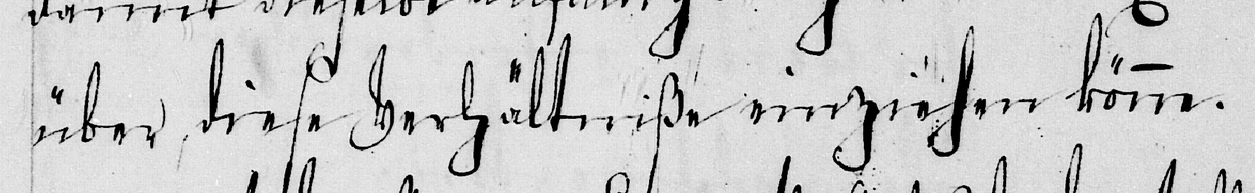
über diese Verhältniße einziehen könne.
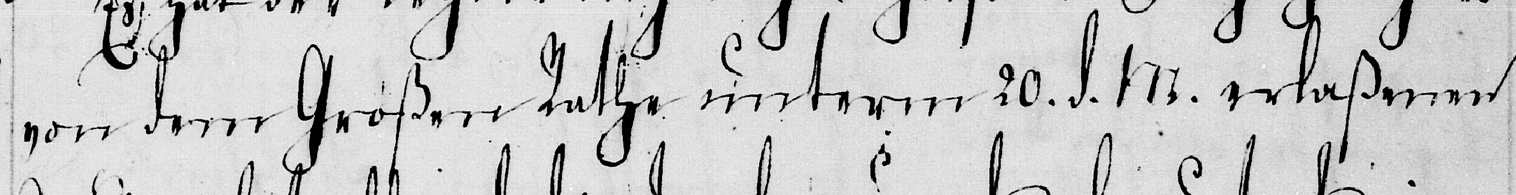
von dem Großen Rathe unterm 20. d. M. erlaßenen
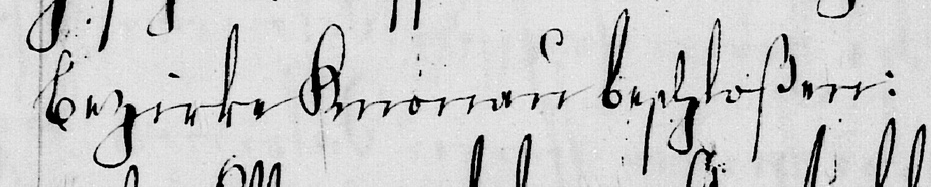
Bezirke Knonau beschloßen:
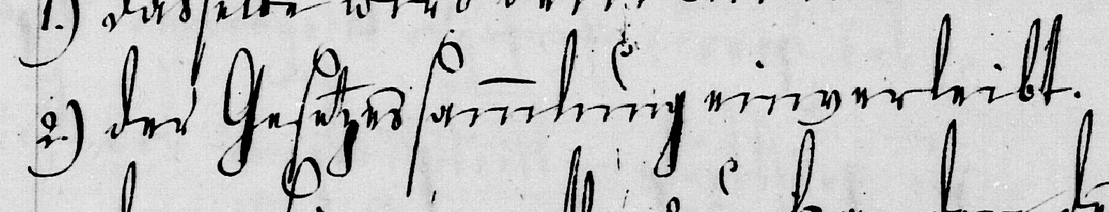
2.) der Gesetzessammlung einverleibt.
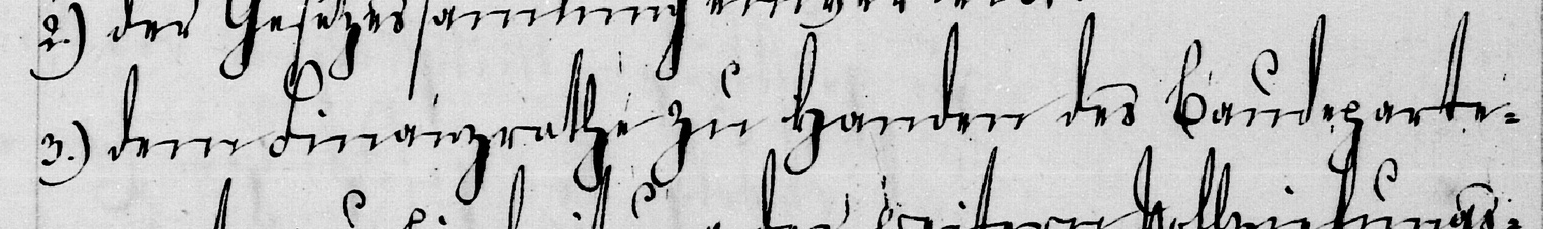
3.) dem Finanzrathe zu Handen des Baudeparte¬
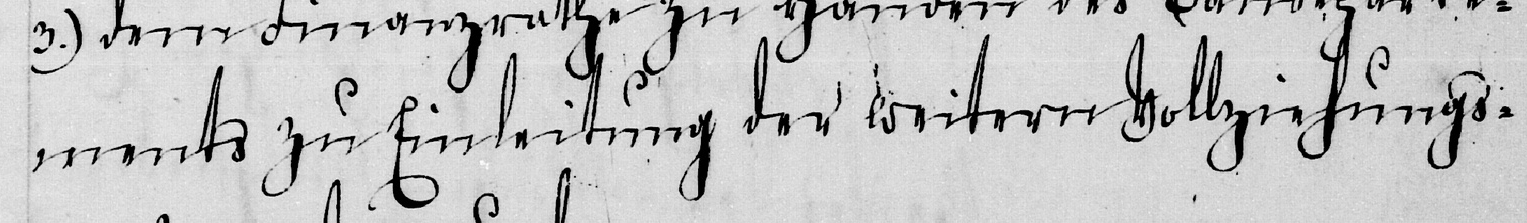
ments zu Einleitung der weitern Vollziehungs¬
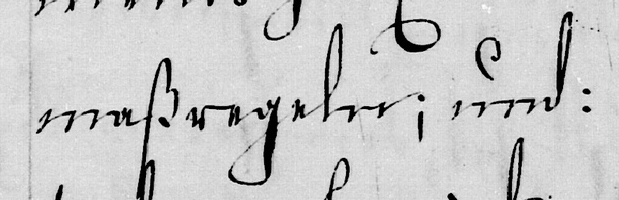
maßregeln; und:
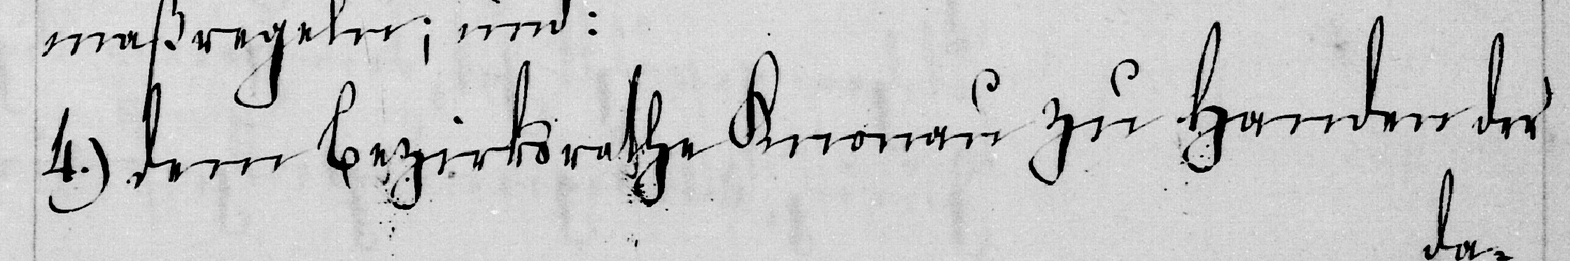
4.) dem Bezirksrathe Knonau zu Handen der
